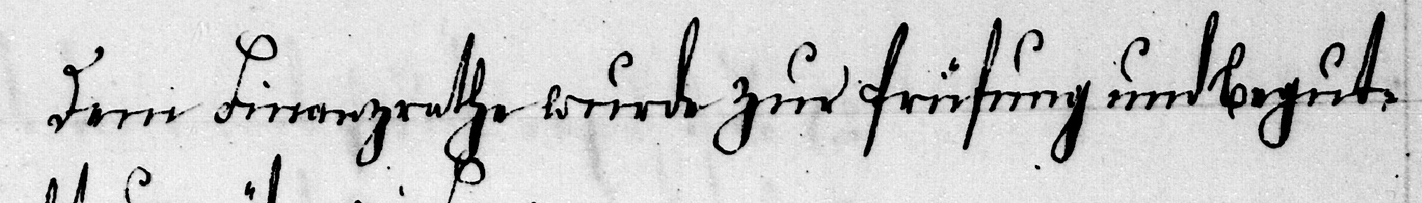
Dem Finanzrathe wurde zur Prüfung und Begut¬
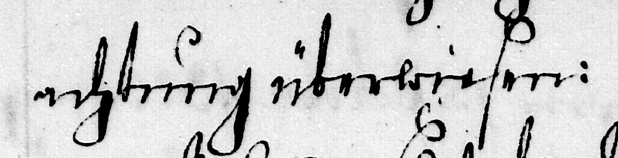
achtung überwiesen:
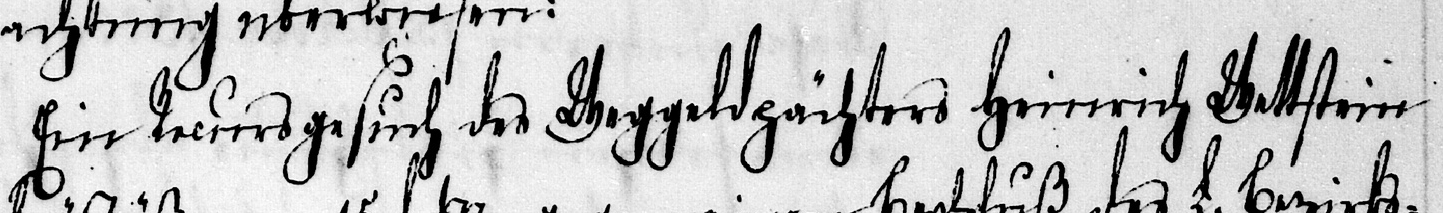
Ein Recursgesuch des Weggeldpächters Heinrich Wettstein
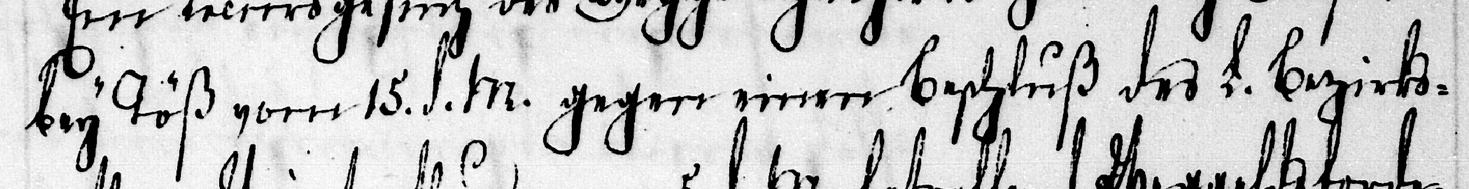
bey Töß vom 15. d. M. gegen einen Beschluß des L. Bezirks¬
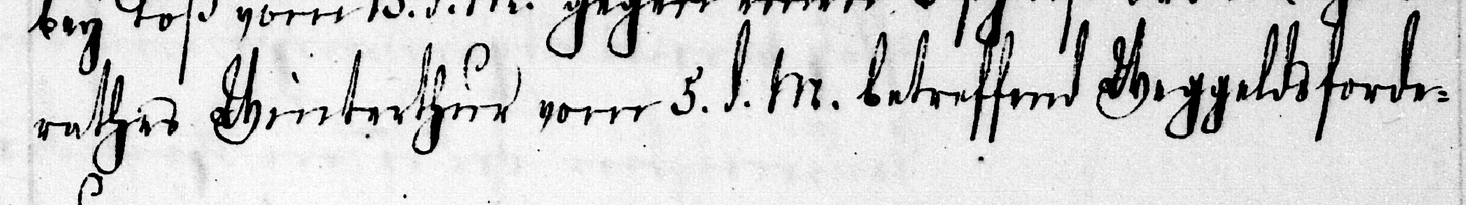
rathes Winterthur vom 5. d. M. betreffend Weggeldsforde¬
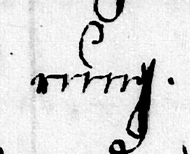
rung.
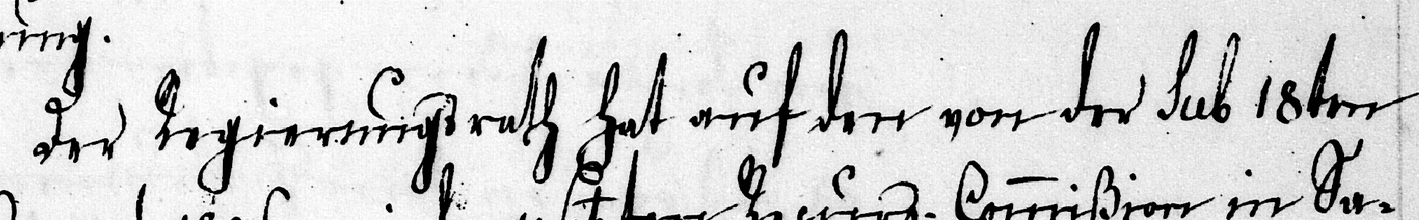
Der Regierungsrath hat auf den von der sub. 18ten
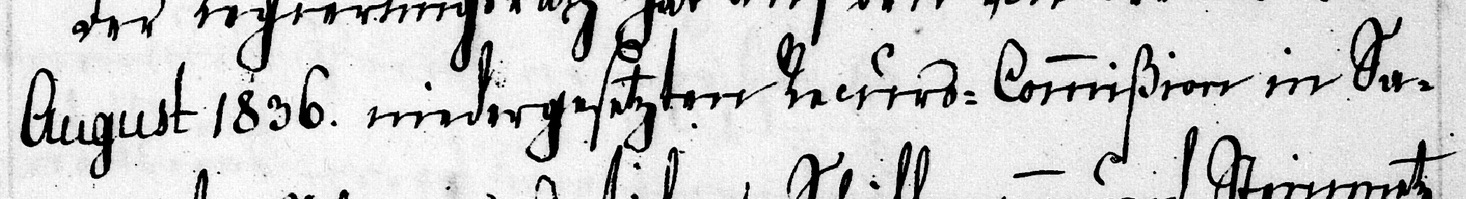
August 1836. eingesetzten Recurs-Commißion in Sa¬
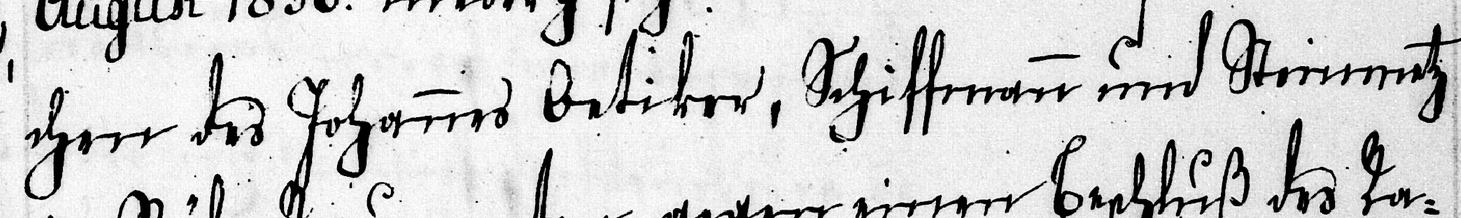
chen des Johannes Oetiker, Schiffmann und Steinmetz
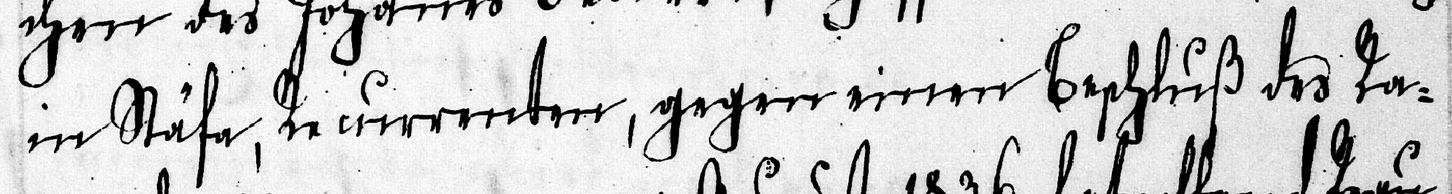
in Stäfa, Recurrenten, gegen einen Beschuß des Ra¬
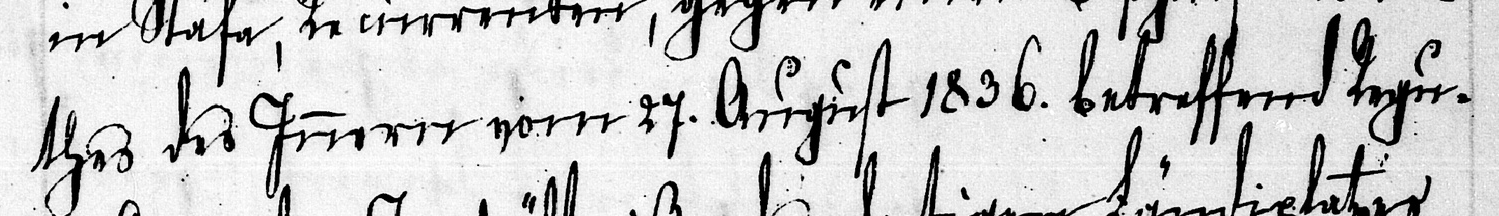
thes des Innern vom 27. August 1836. betreffend Regu¬
